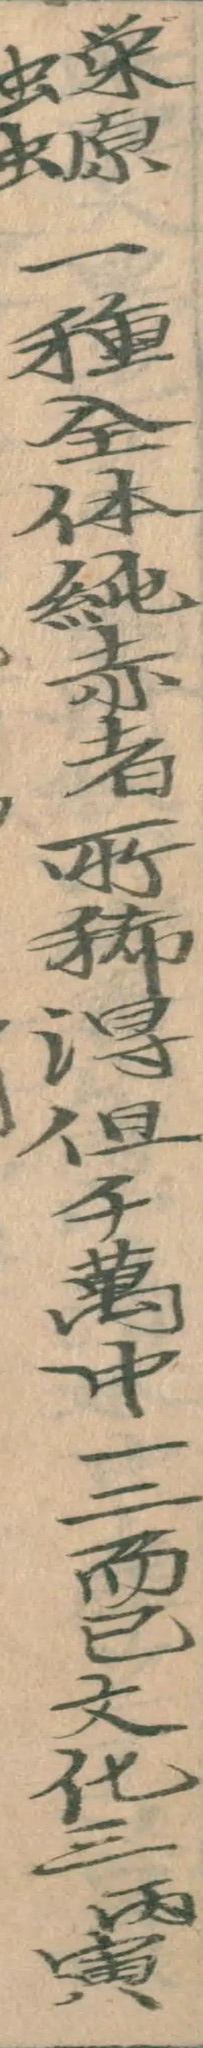蠑螈一種全体純赤者所稀淂但千萬中一二而已文化三丙寅
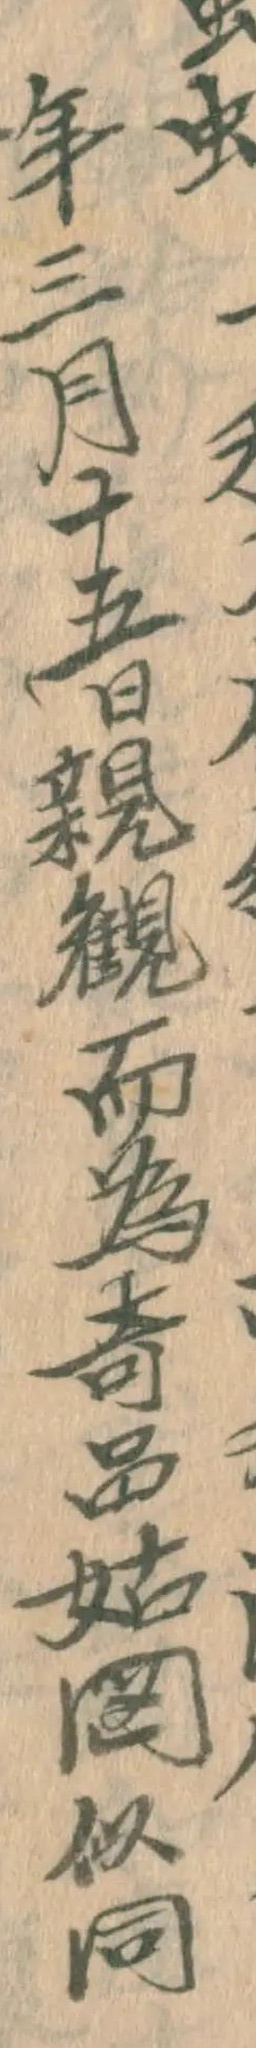年三月十五日親観而為奇品姑図似同
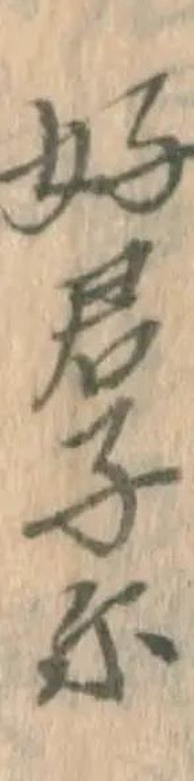好君子尓
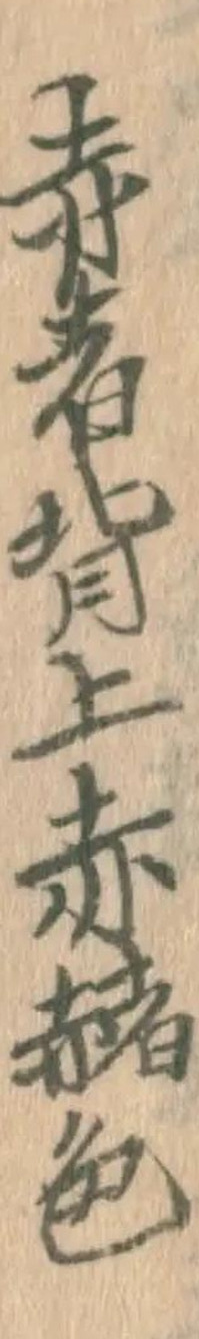赤者背上赤赭色
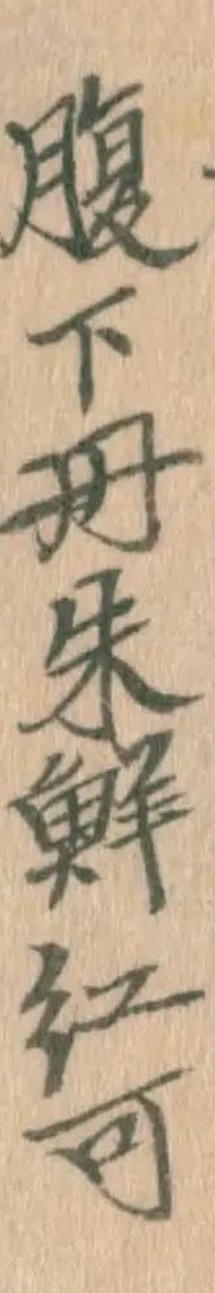腹下丹朱鮮紅可
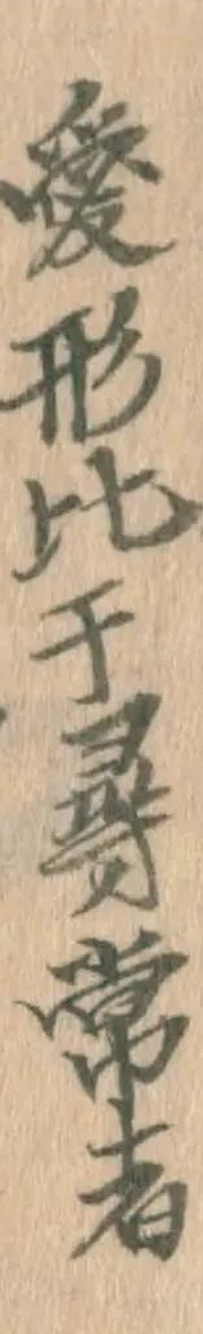愛形比于尋常者
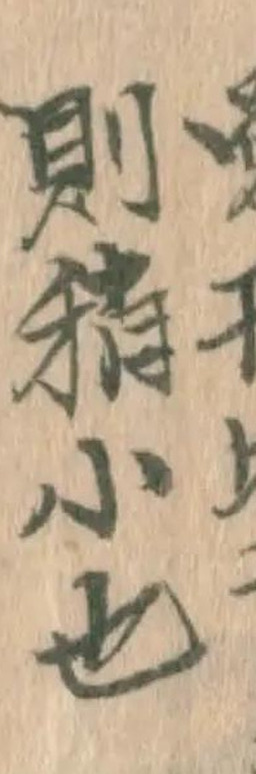則稍小也

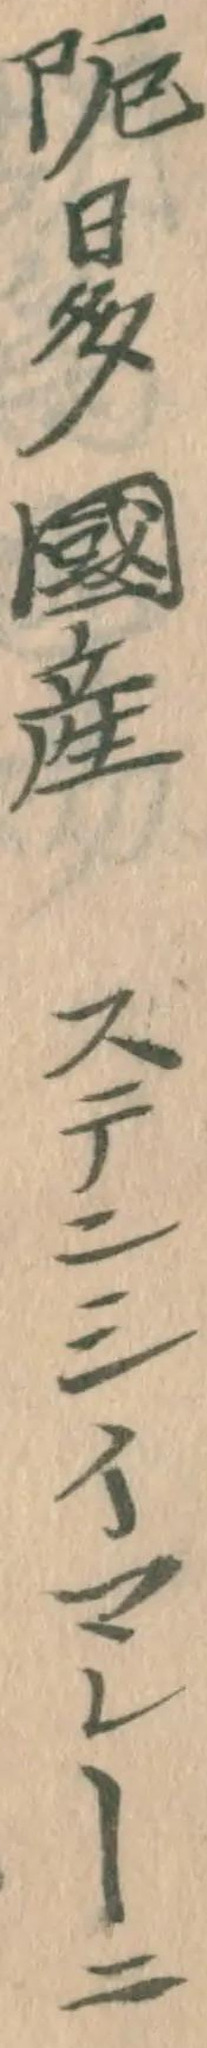阨日多國産ステンシイマレーニ
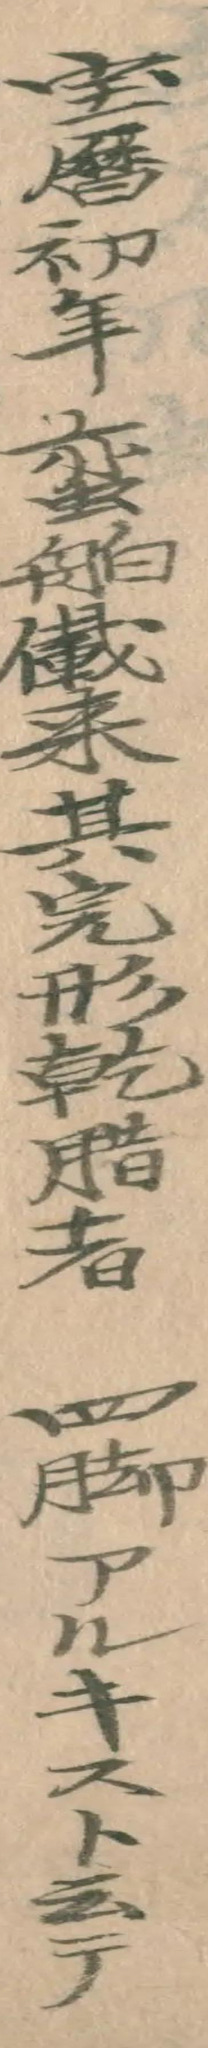宝暦初年蛮舶儎来其完形乾腊者四脚アルキスト云テ
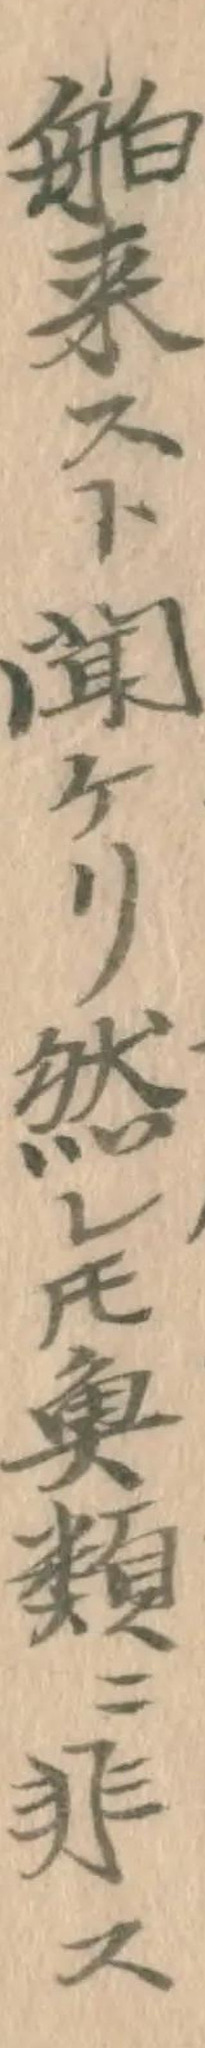舶来スト聞ケリ然レトモ魚類ニ非ス
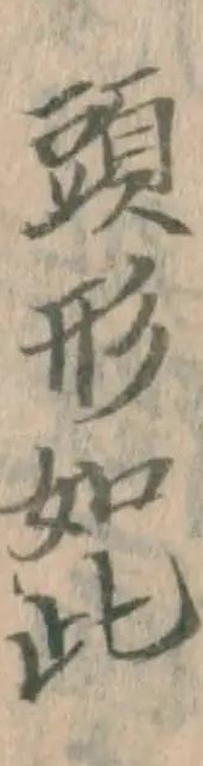頭形如此

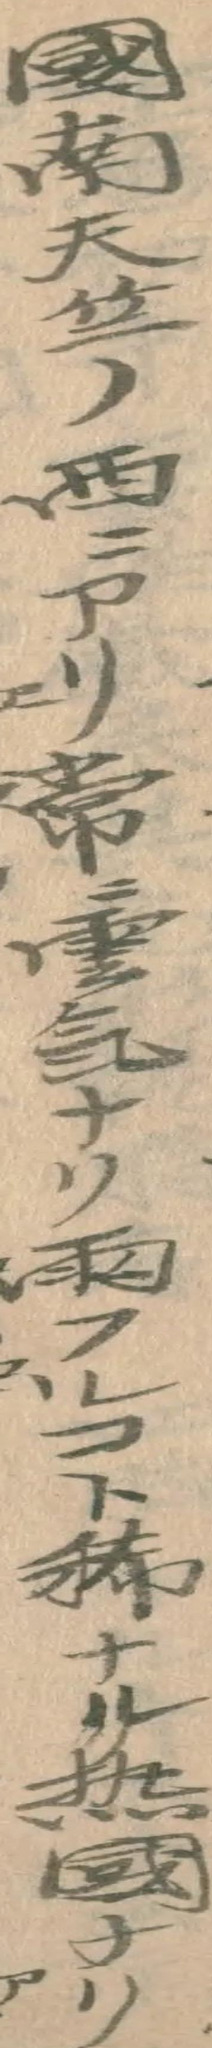國南天竺ノ西ニアリ常ニ雲気ナリ雨フルコト稀ナル熱國ナリ
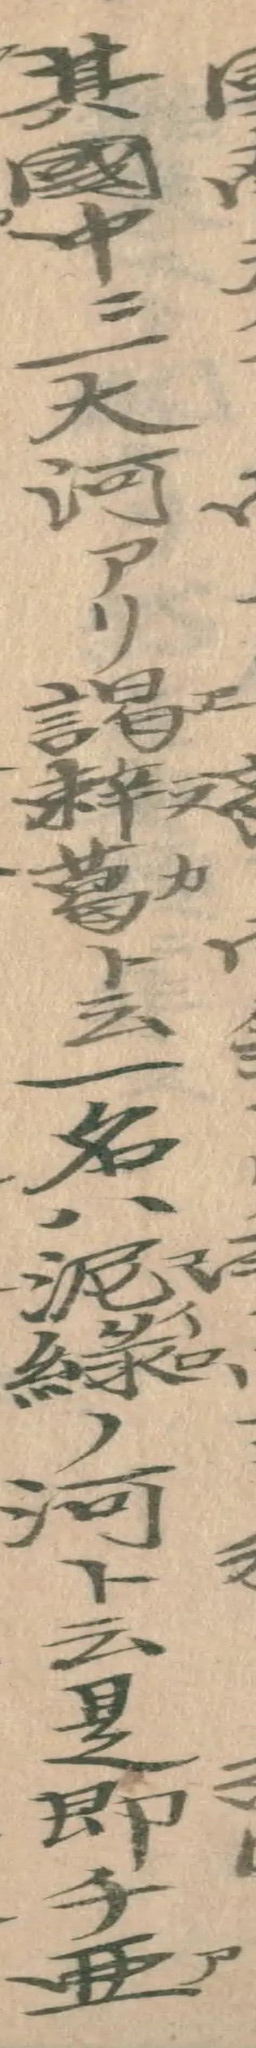其國中ニ一大河アリ謁辣葛ト云一名ハ泥緑ノ河ト云是即チ亜
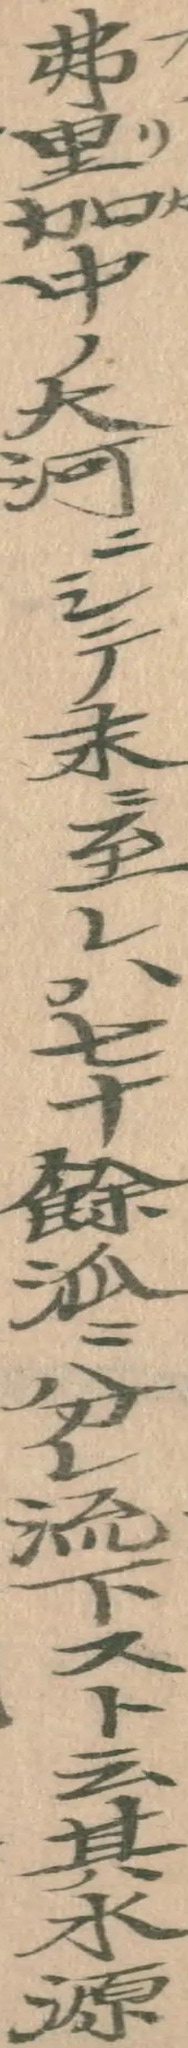弗里加中ノ大河ニシテ末ニ至レハ七十餘泒ニ分レ流下スト云其水源
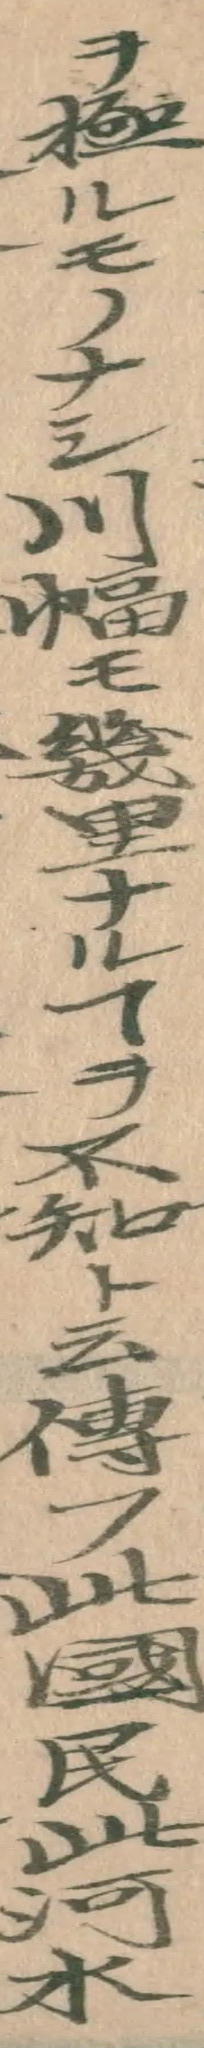ヲ極ルモノナシ川幅モ幾里ナルコトヲ不知ト云傳フ此國民此河水
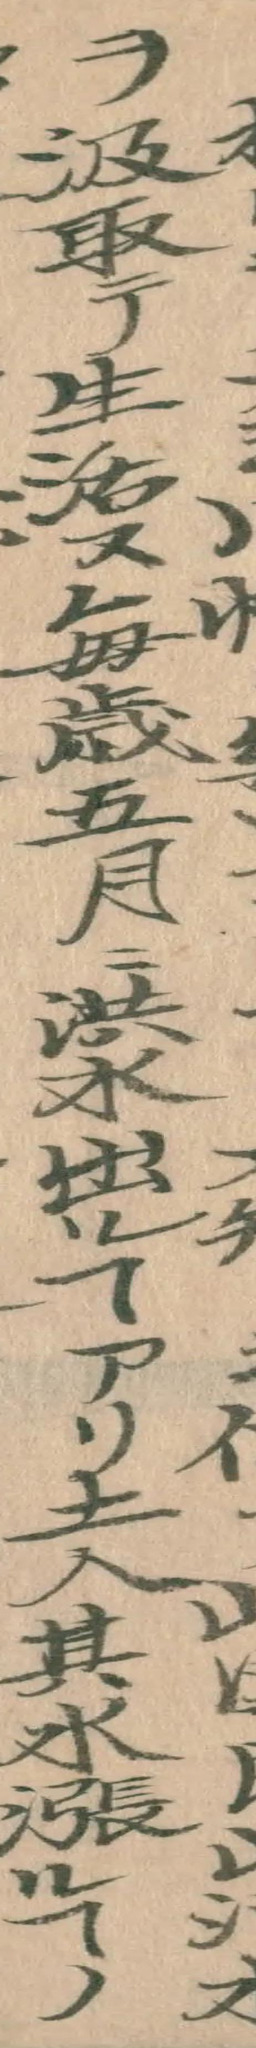ヲ汲取テ生活ス毎歳五月ニ洪水出ルコトアリ土人其水漲ルコトノ
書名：千蟲譜 3巻. [1]
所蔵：国立国会図書館 National Diet Library, JAPAN
